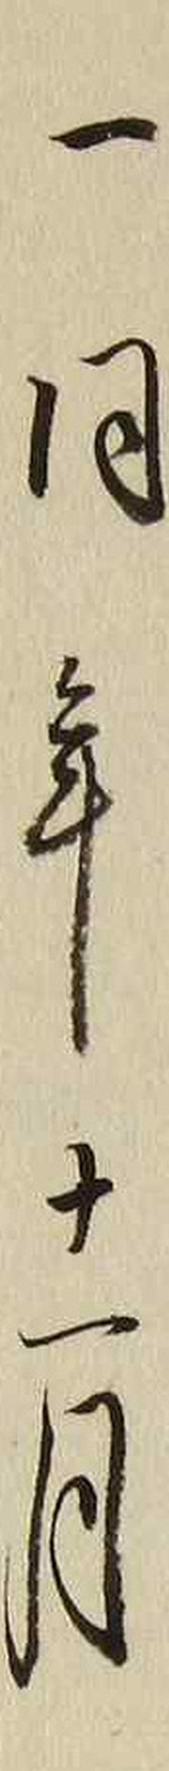一同年十一月
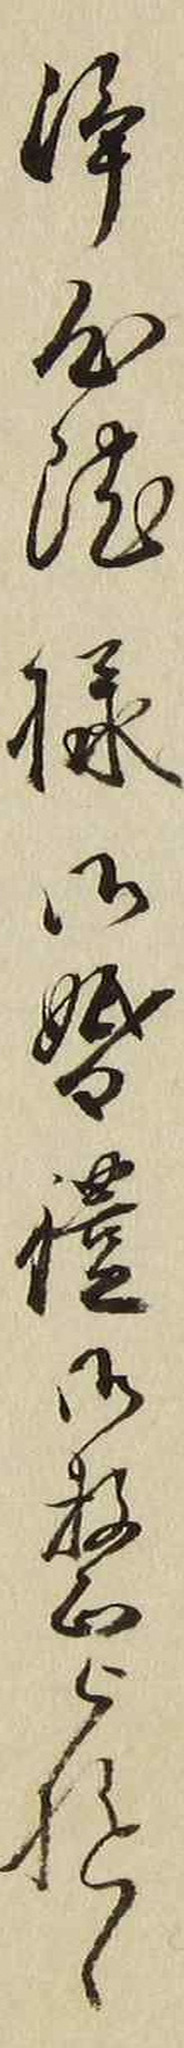浄心院様御婚礼御整被遊候
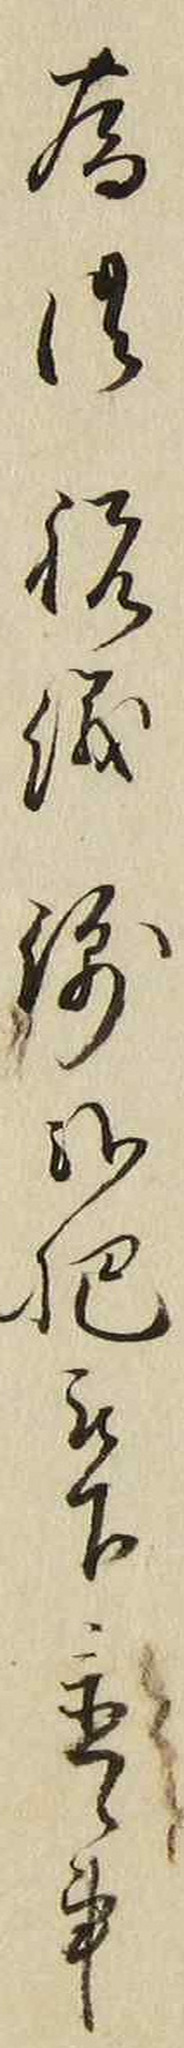為御祝儀綿弐把被下置候事
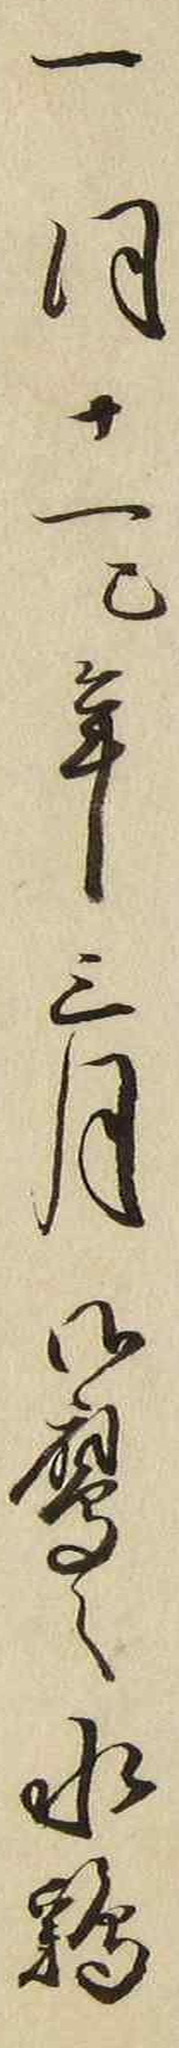一同十一巳年三月御鷹之水鶏

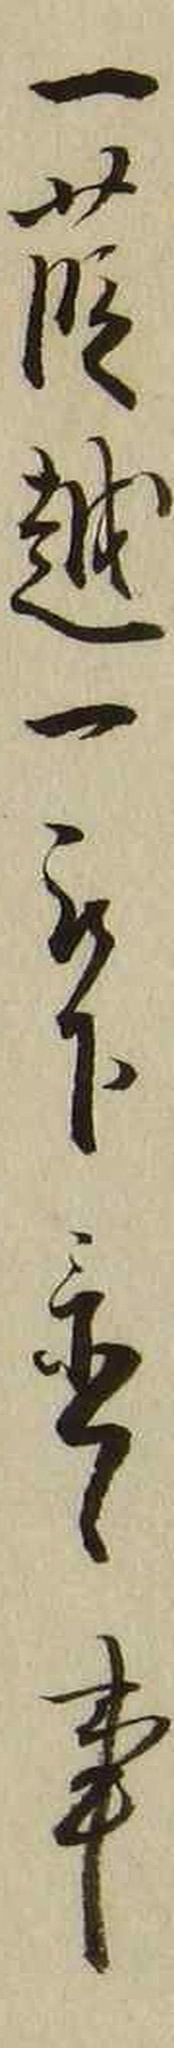一葭越一被下置候事
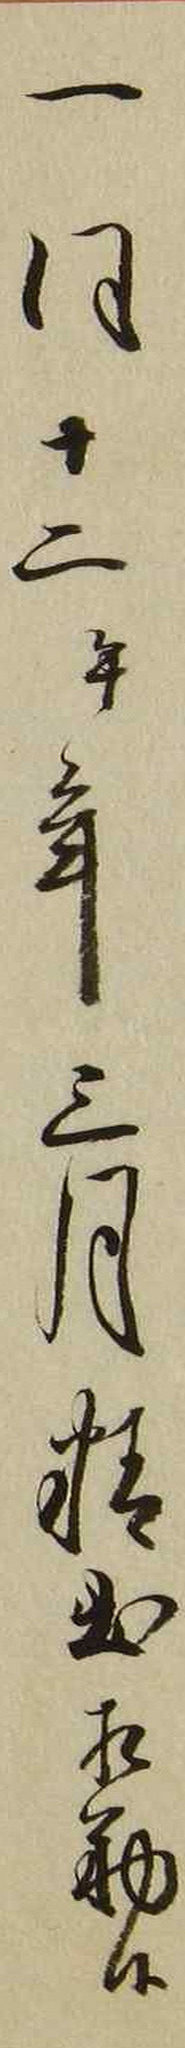一同十二午年三月精出相勤候
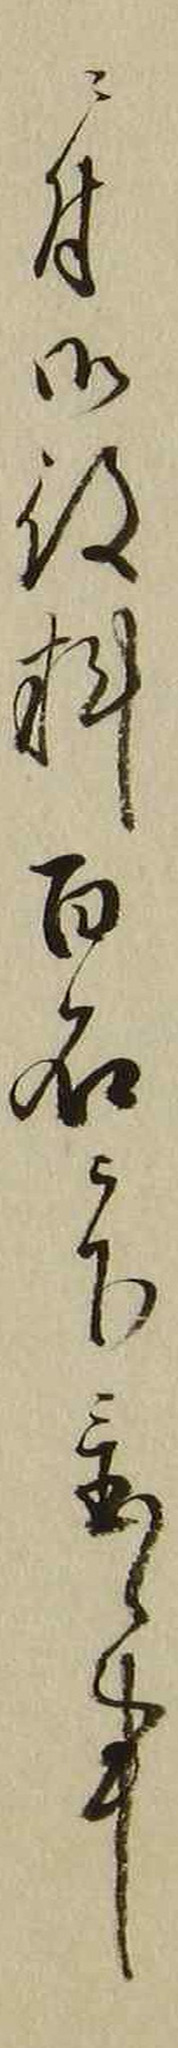ニ付御役料百石被下置候事
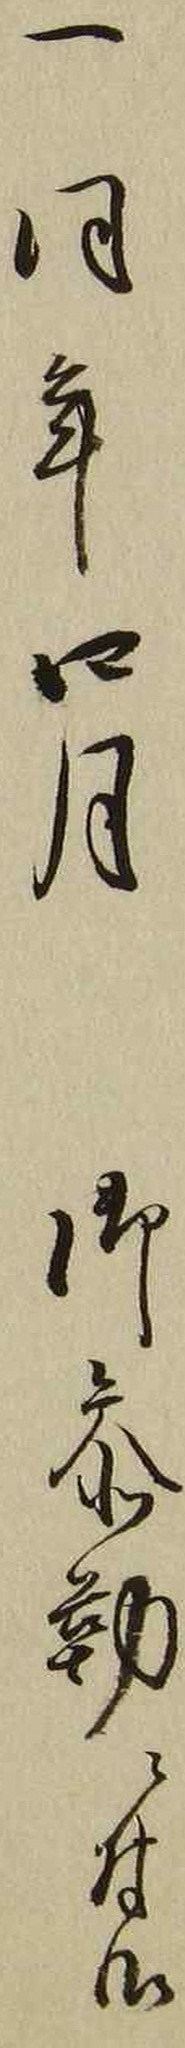一同年四月御参勤ニ付御
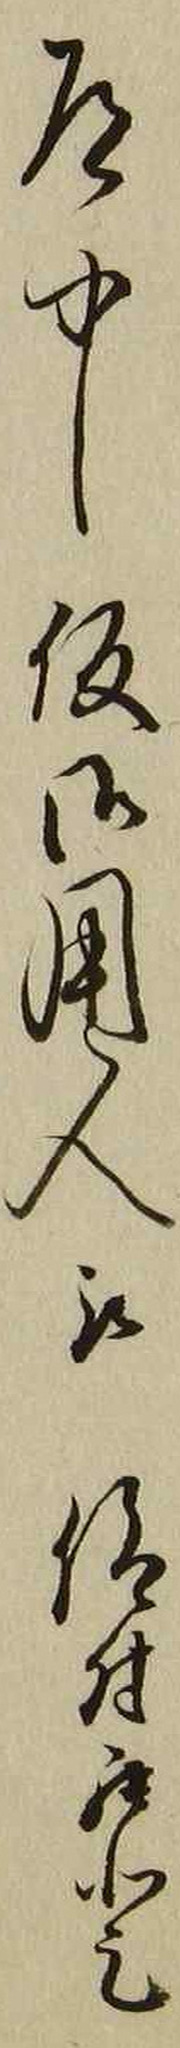道中仮御用人被仰付罷登
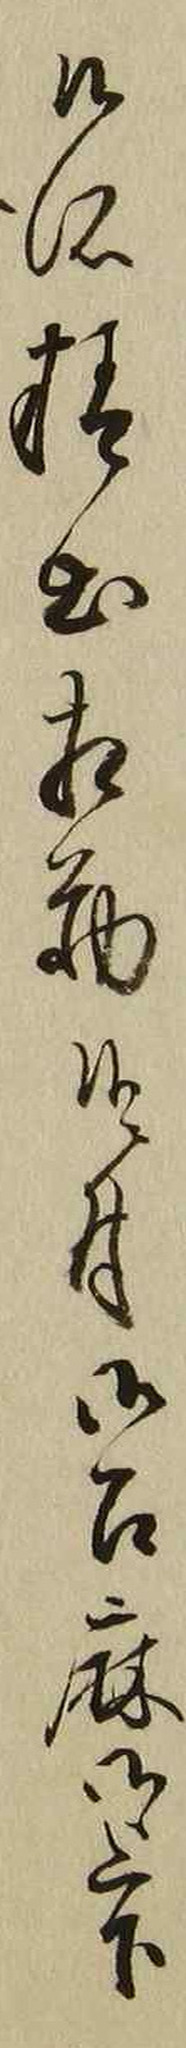候所精出相勤候ニ付御召麻御上下
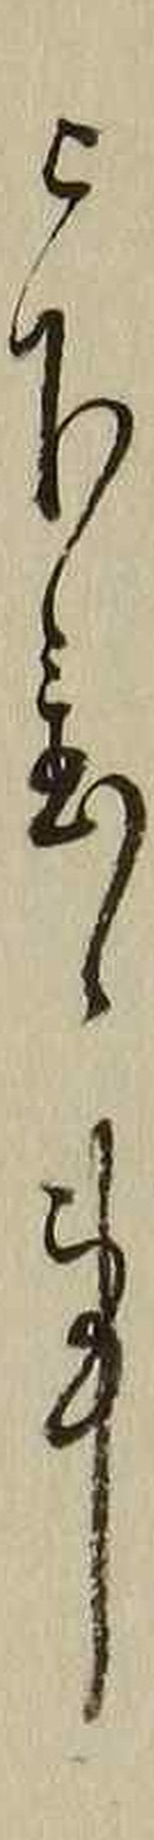被下置候事
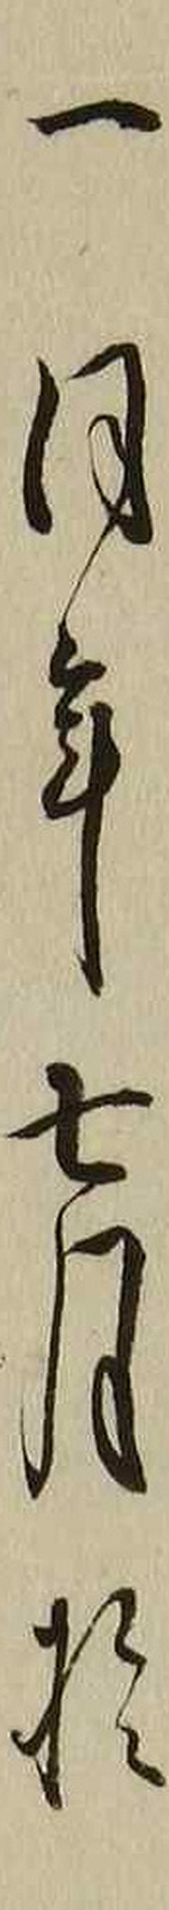一同年七月於
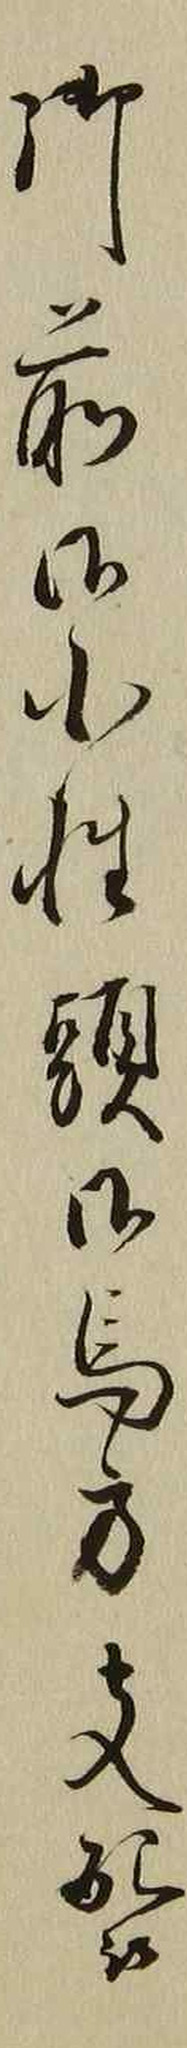御前御小性頭御馬方支配被
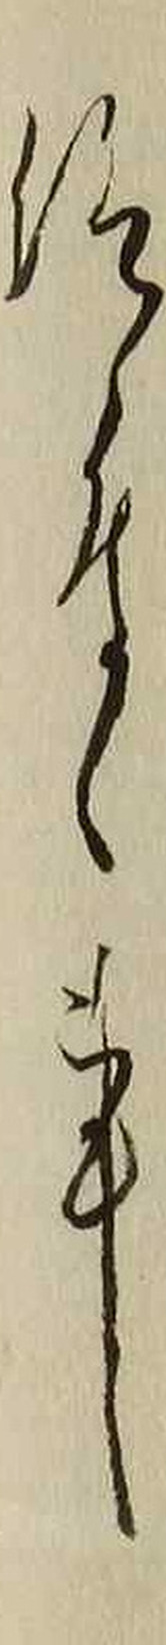仰付候事
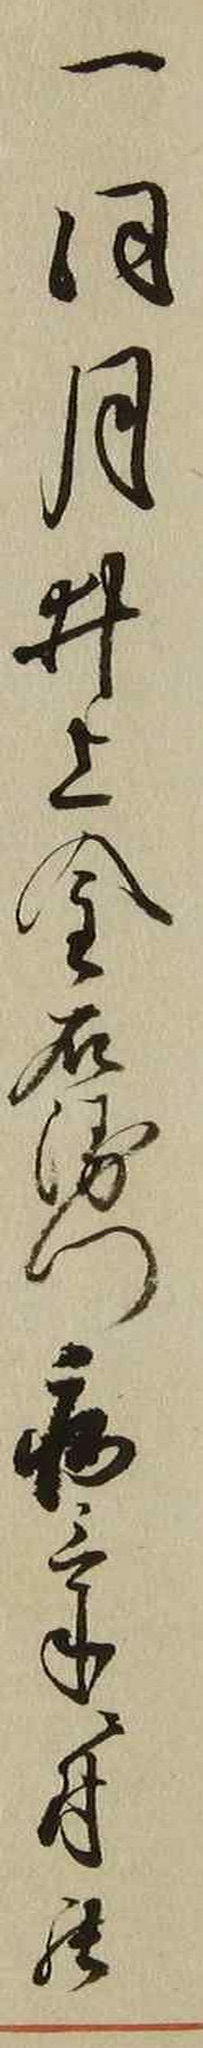一同月井上金右衛門病気ニ付罷
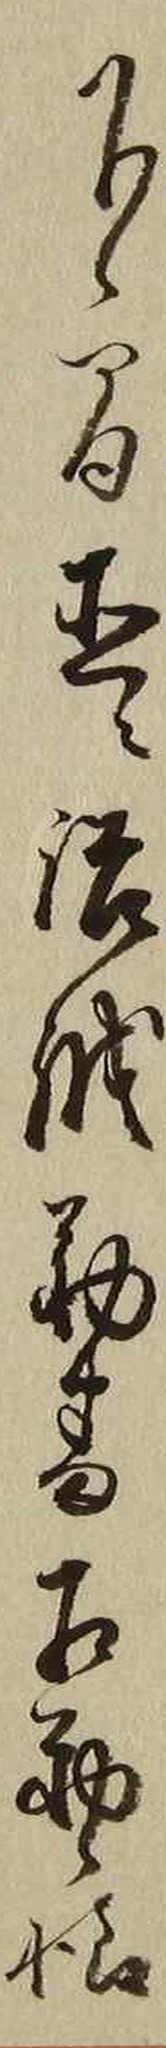下候間直ニ詰越勤番相勤候様
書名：諸士系譜　巻之1　い之部1
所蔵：会津若松市立会津図書館
